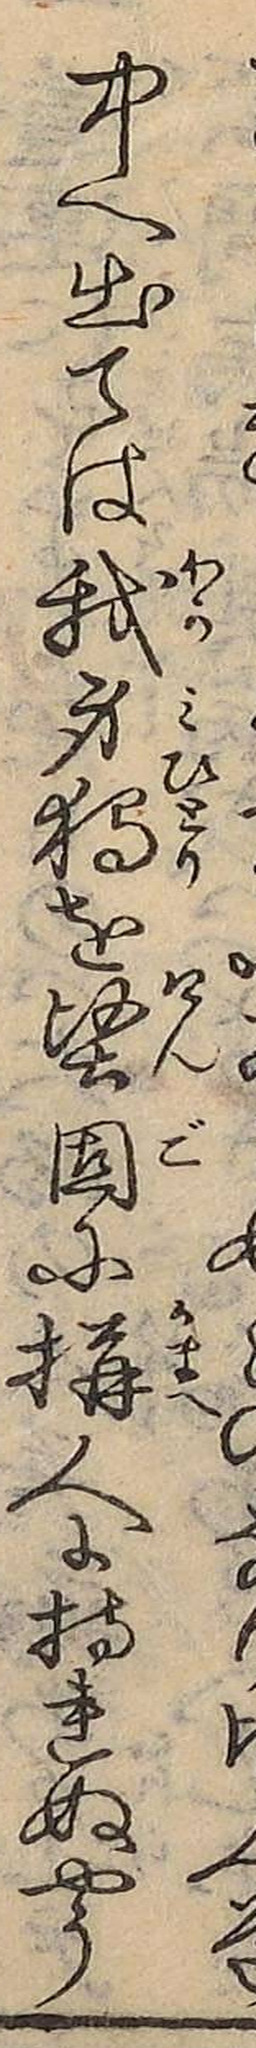中へ出ては我身独を堅固に構人に持れぬやう
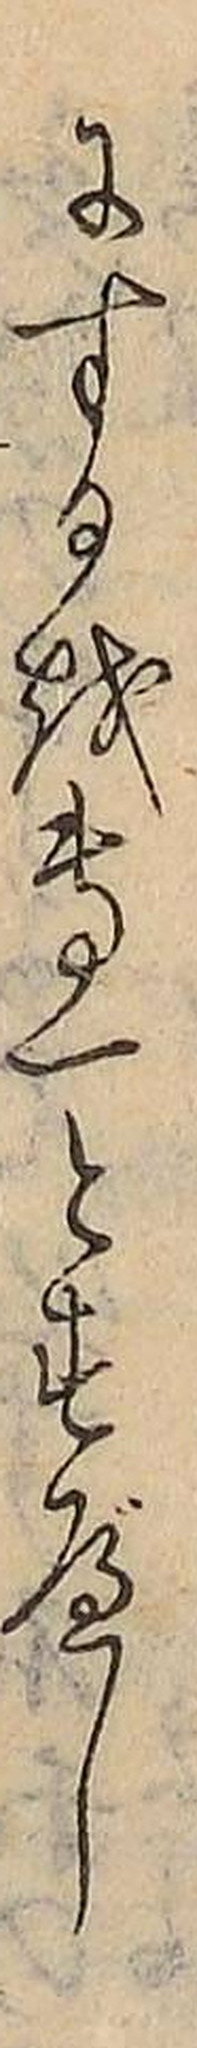にするをき専一とすべし

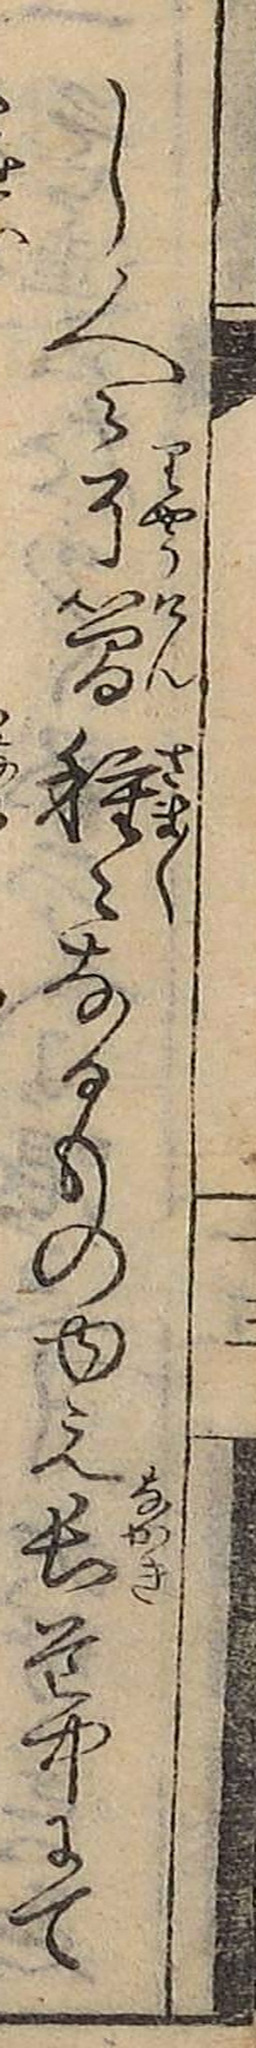し人々了簡種々なるものゆえ長道中にて
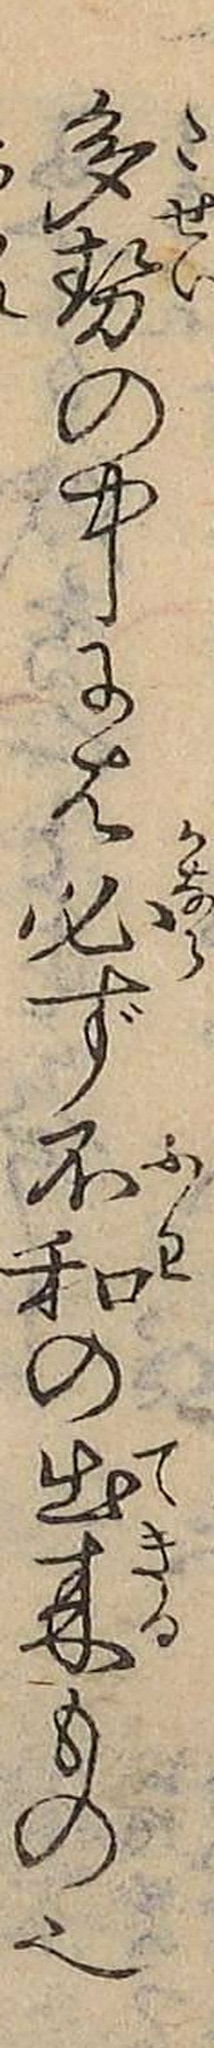多勢の中には必ず不和の出来もの也
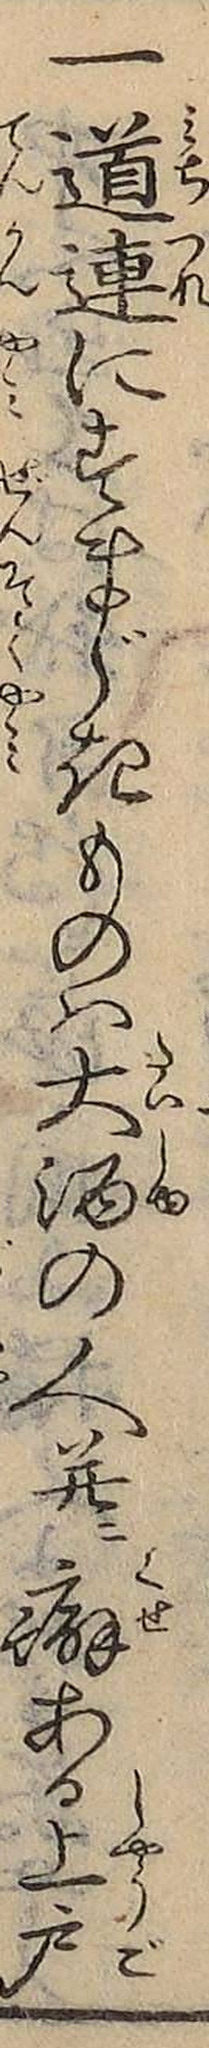一道連にすまじきものは大酒の人并癖ある上戸
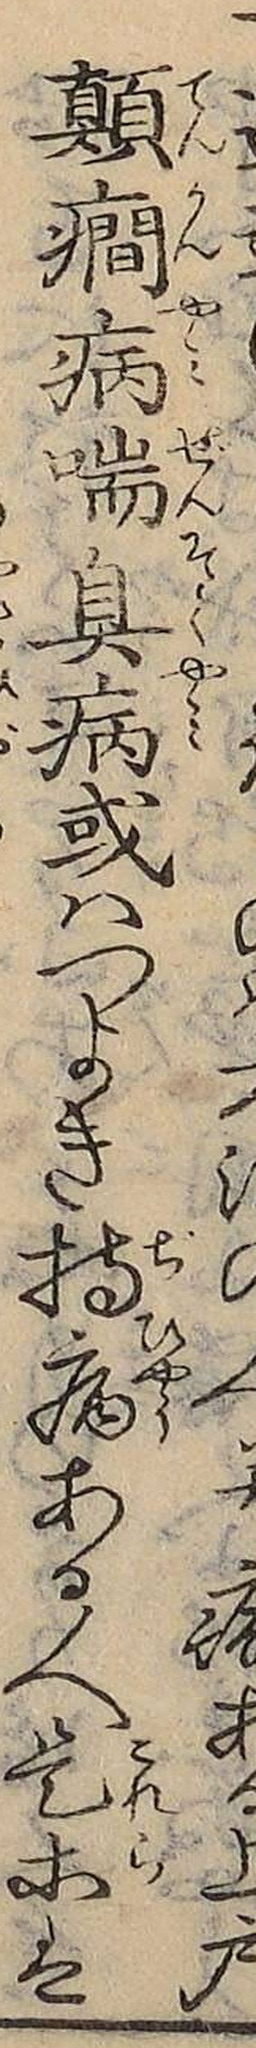顛癇病喘臭病或はつよき持病ある人是等は
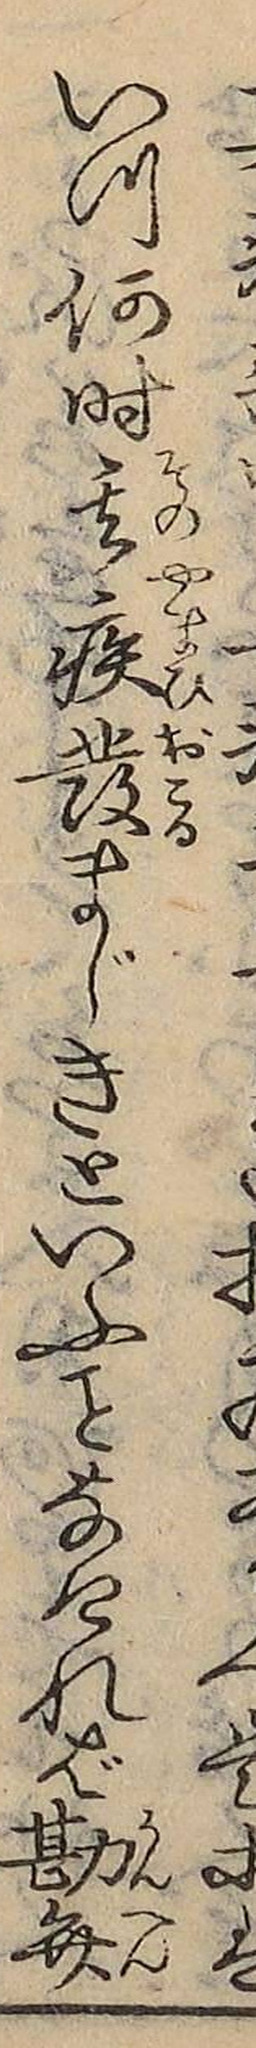いつ何時其疾発まじきといふことなければ勘弁
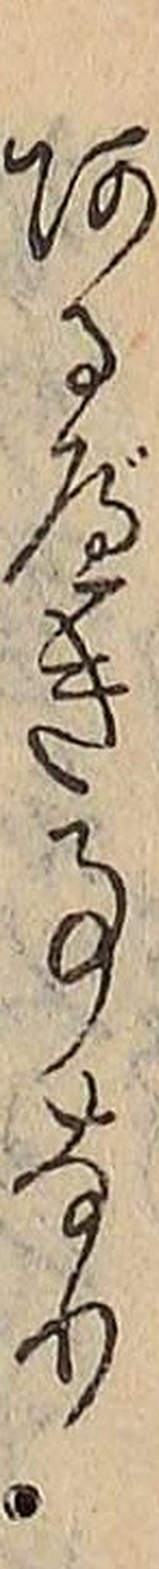あるべき事なり
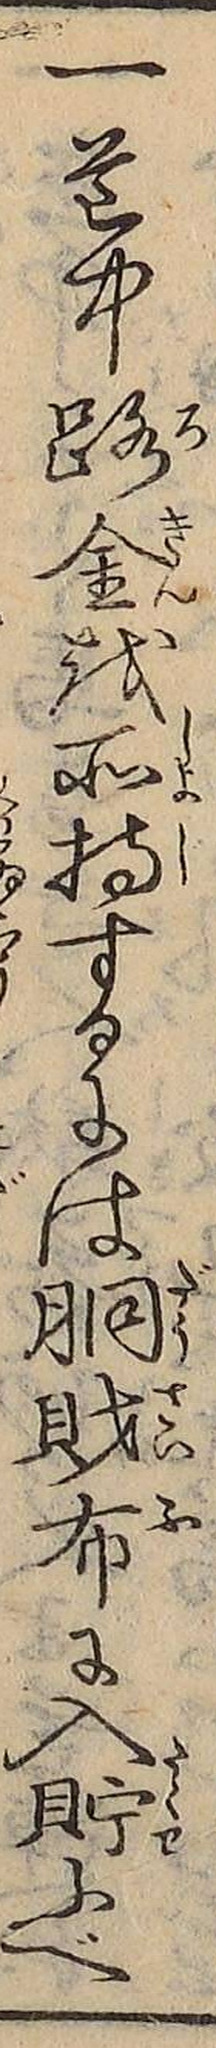一道中路金を所持するには胴財布に入貯ふべ
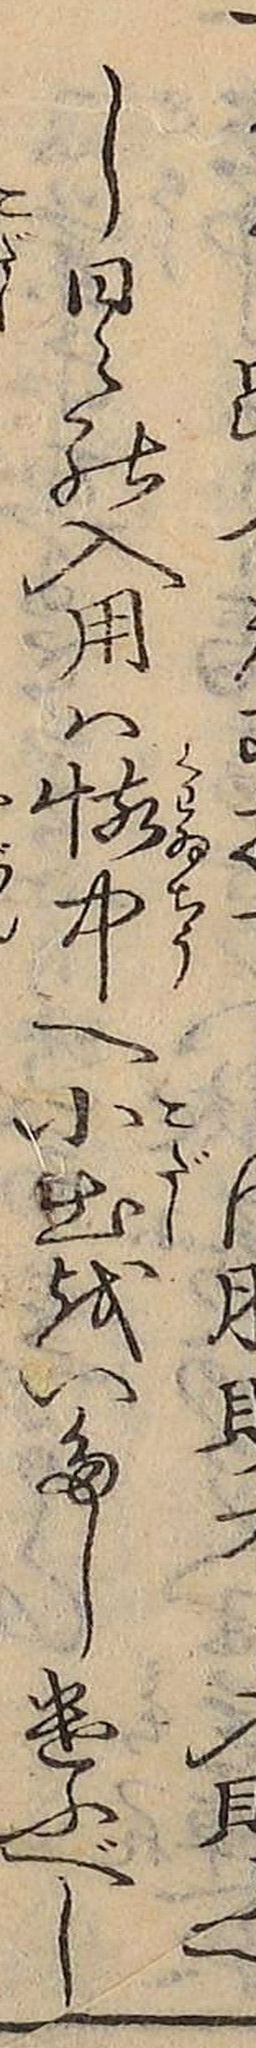し日々の入用は懐中へ小出をいたし遣ふべし
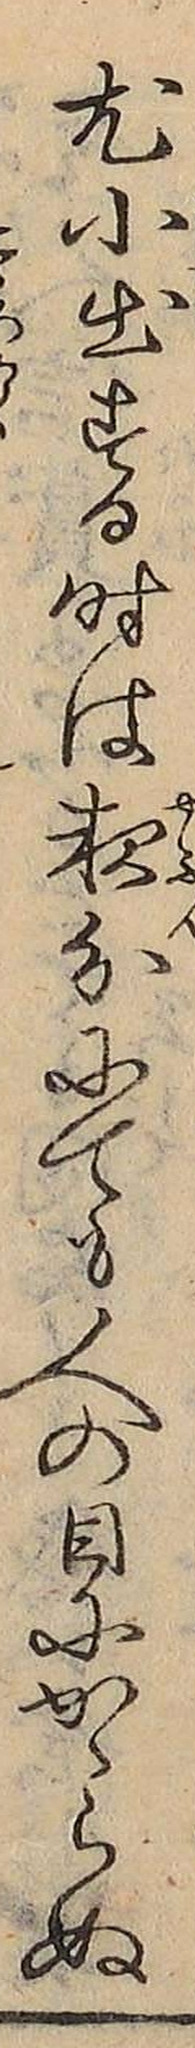尤小出する時は夜分にても人の目にかゝらぬ
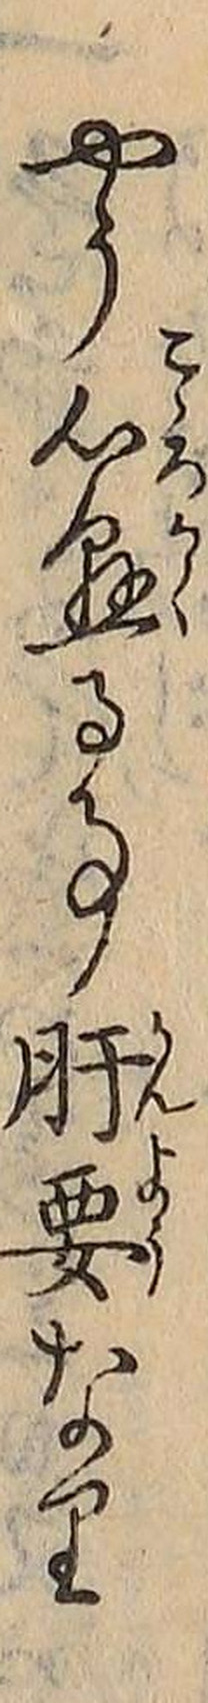やう心懸る事肝要なり
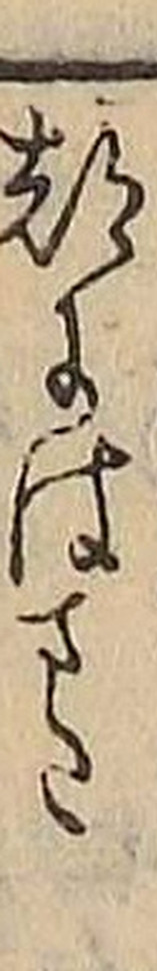都にはまた
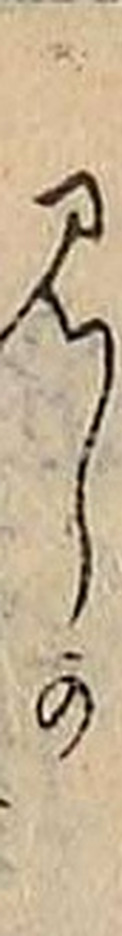見しか
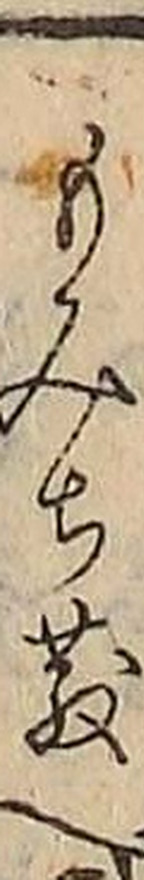もみち散
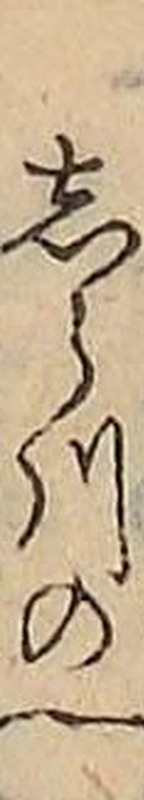しら川の
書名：旅行用心集
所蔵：神戸大学附属図書館 国文学研究資料館
